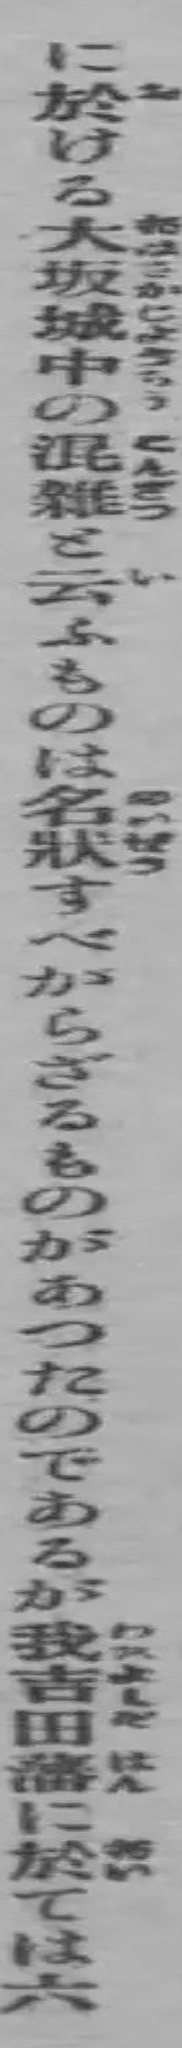に於ける大坂城中の混雑と云ふものは名状すべからざるものがあつたのであるが我吉田藩に於ては六
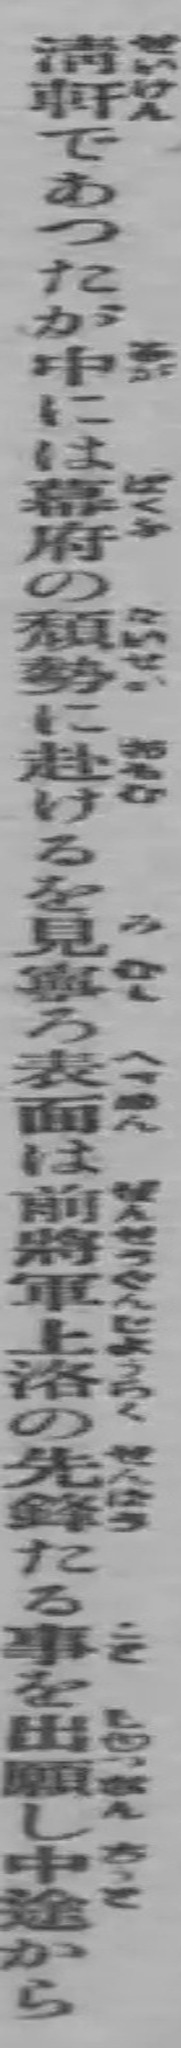清軒であつたが中には幕府の頽勢に赴けるを見寧ろ表面は前将軍上洛の先鋒たる事を出願し中途から
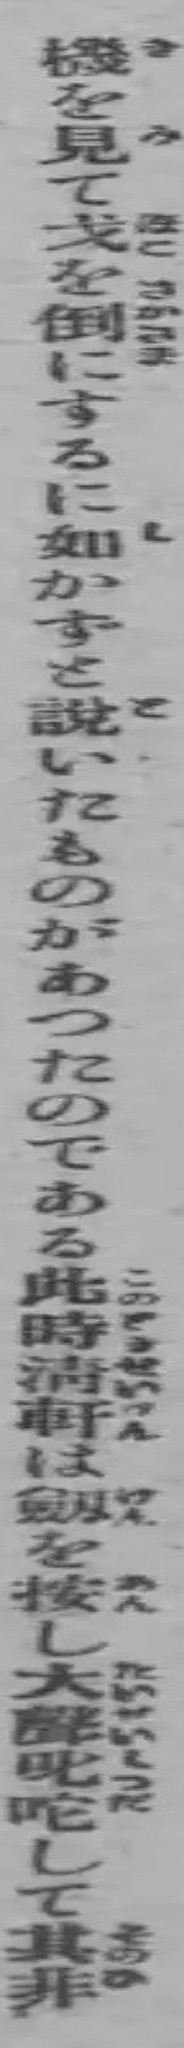機を見て戈を倒にするに如かずと説いたものがあつたのである此時清軒は𠝏を按し大声叱咤して其非
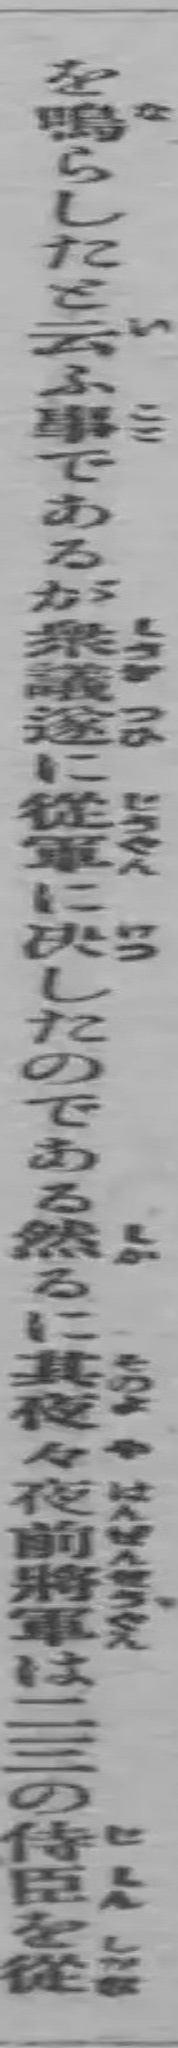を鳴らしたと云ふ事であるが衆議遂に従軍に決したのである然るに其夜々夜前将軍は二三の侍臣を従
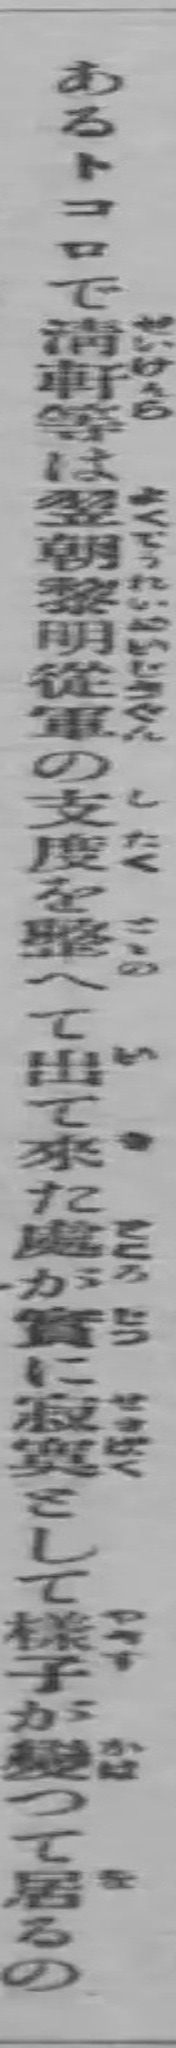あるトコロで清軒等は翌朝黎明従軍の支度を整へて出て来た処が実に寂寞として様子が変つて居るの
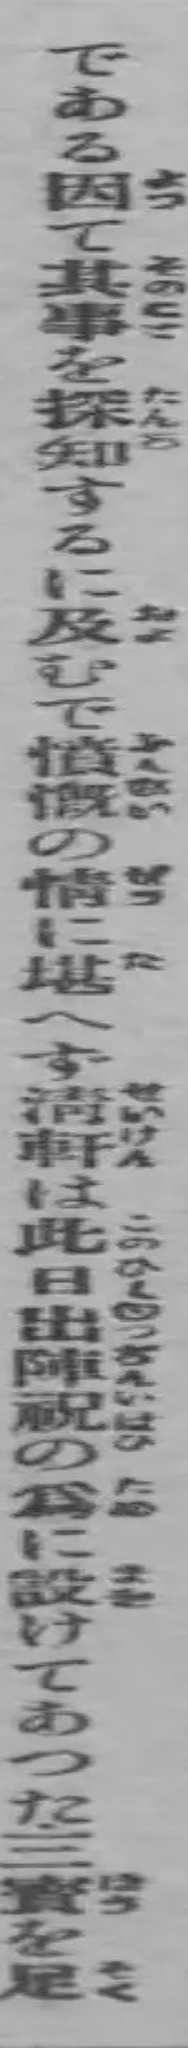である因て其事を探知するに及むで憤慨の情に堪へず清軒は此日出陣祝の為に設けてあつた三宝を足
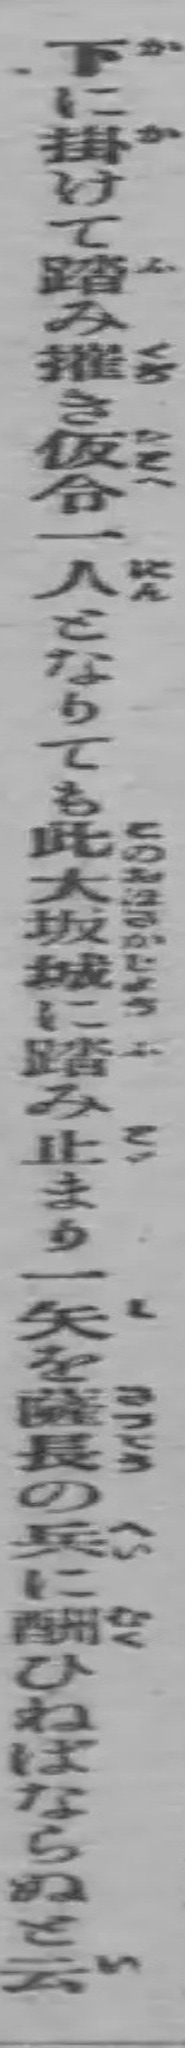下に掛けて踏み摧き仮令一人となりても此大坂城に踏み止まり一矢を薩長の兵に酬ひねばならぬと云
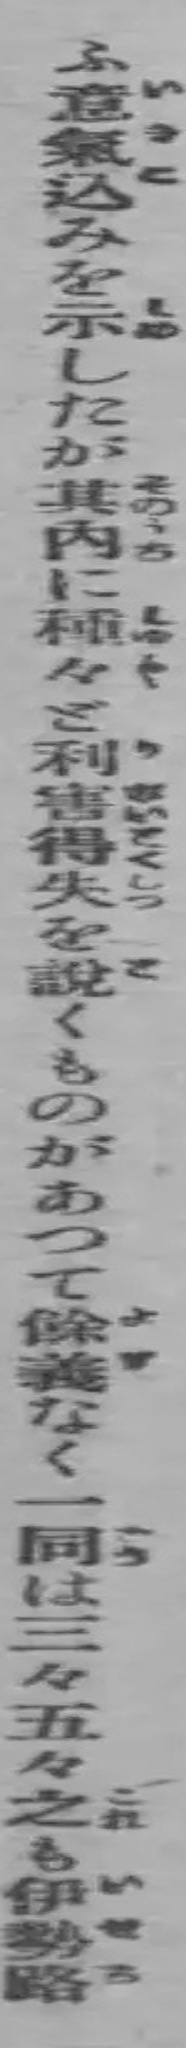ふ意気込みを示したが其内に種々と利害得失を説くものがあつて余儀なく一同は三々五々之も伊勢路

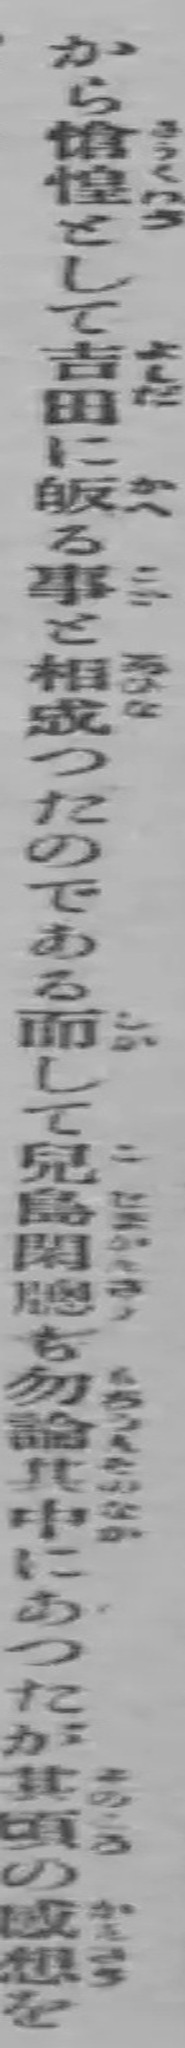から愴惶として吉田に昄る事と相成つたのである而して児島閑牕も勿論其中にあつたが其頃の感想を
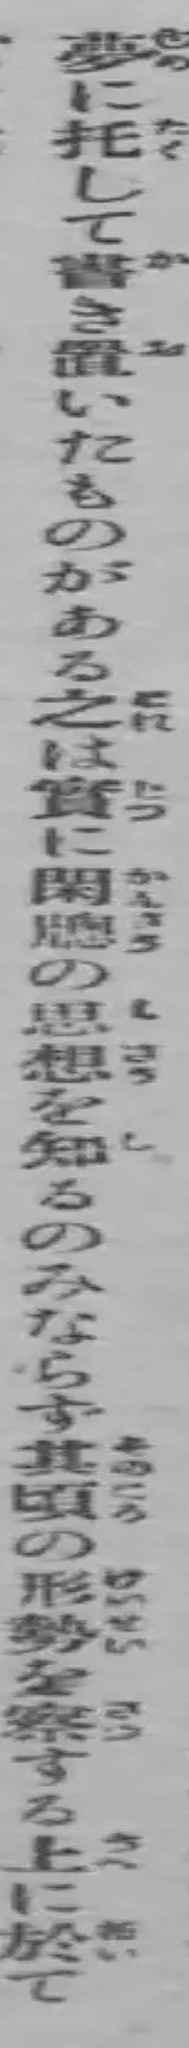夢に托して書き置いたものがある之は実に閑牕の思想を知るのみならず其頃の形勢を察する上に於て
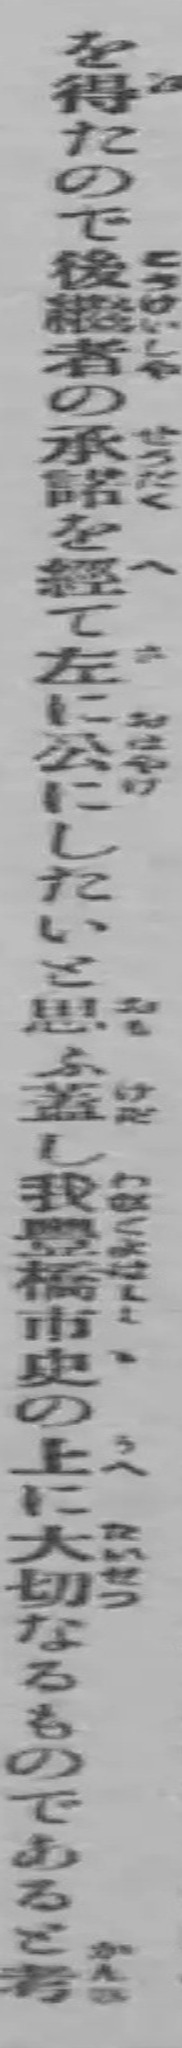を得たので後継者の承諾を経て左に公にしたいと思ふ蓋し我豊橋市史の上に大切なるものであると考
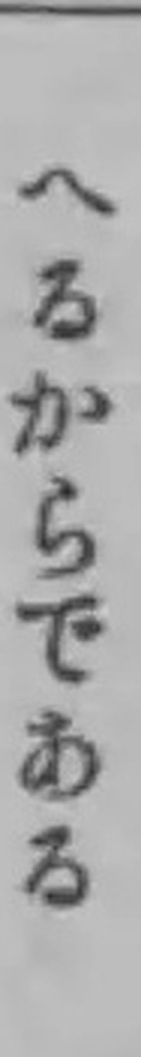へるからである
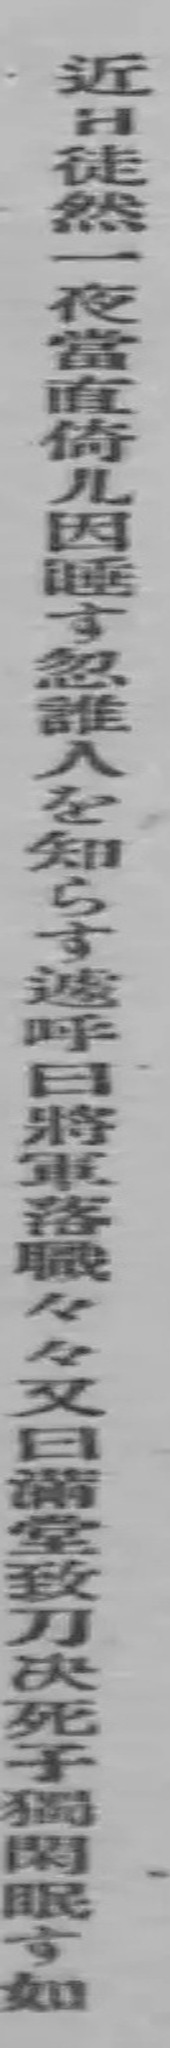近日徒然一夜当直倚儿因睡す忽誰人を知らす遽呼曰将軍落職々々又曰満堂致刀決死子独閑眠す如
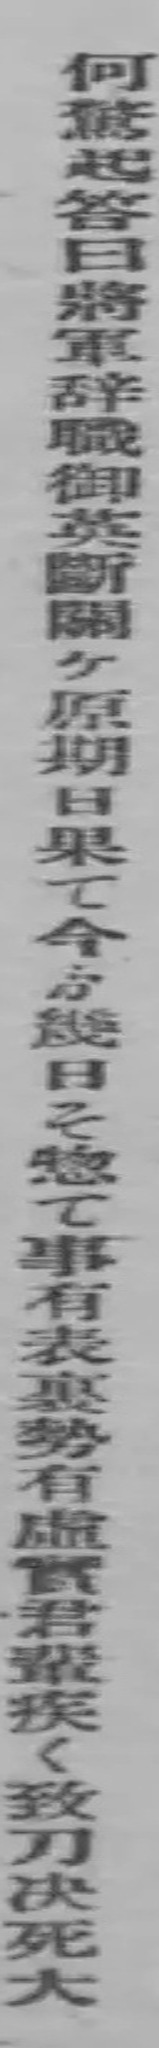何驚起答曰将軍辞職御英断関ケ原期日果て今ゟ幾日そ惣て事有表裏勢有虚実君輩疾く致刀決死大
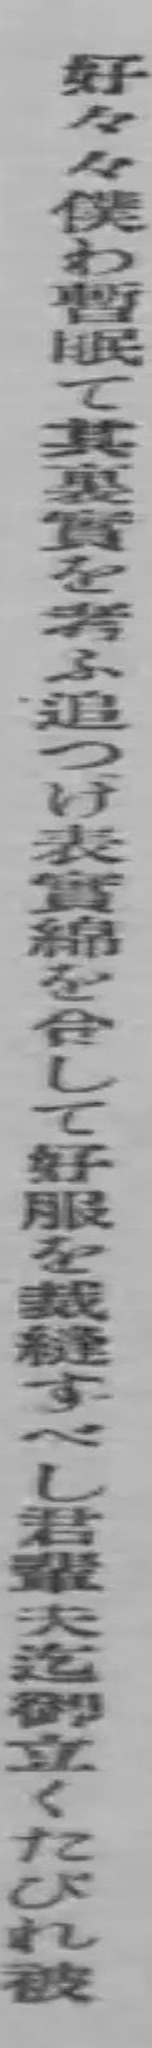好々々僕わ暫眠て其裏実を考ふ追つけ表実綿を合して好服を裁縫すべし君輩夫迄御立くたびれ被
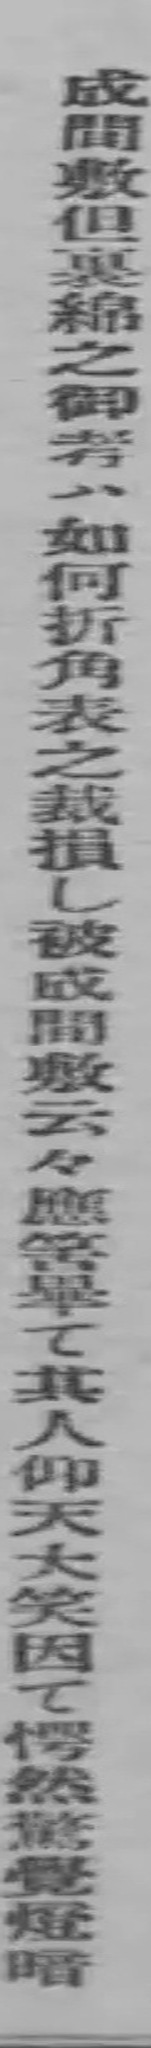成間敷但裏綿之御考ハ如何折角表之裁損し被成間敷云々応筈畢て其人仰天大笑因て愕然驚覚燈暗
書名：豊橋市史談
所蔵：国立国会図書館 National Diet Library, JAPAN
